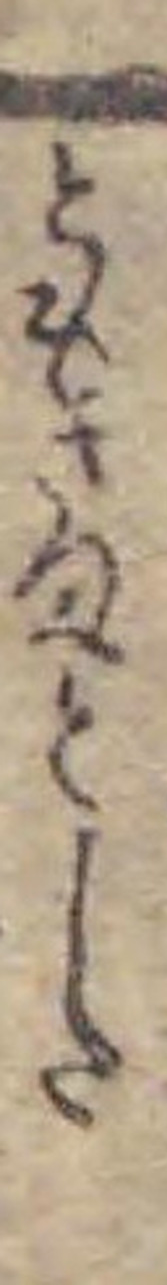ともさまとした
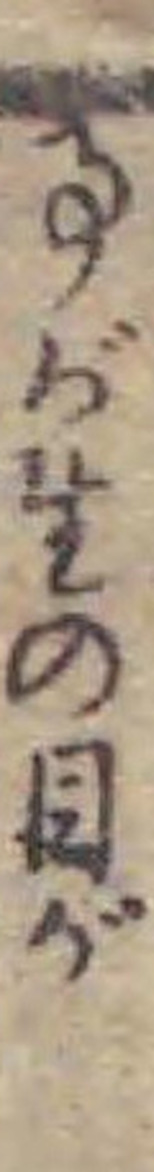事が生の目が
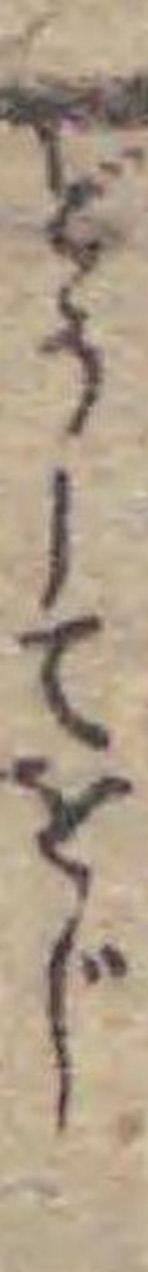どうしてをじ
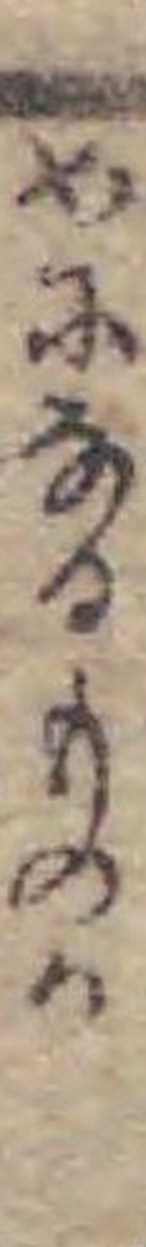めになるものか
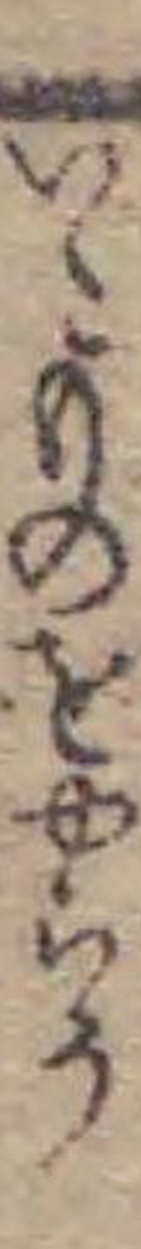いゝものをやらう
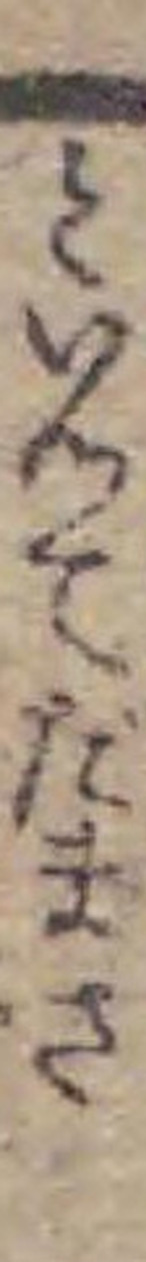といつてだまさ
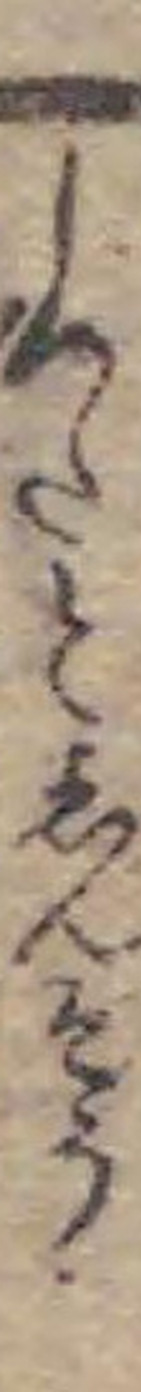しつたとしんぞう
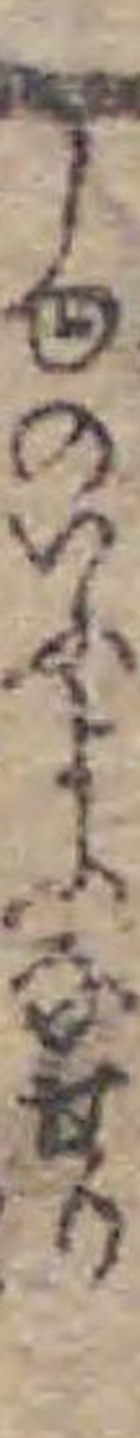しゆのいふよふなせり
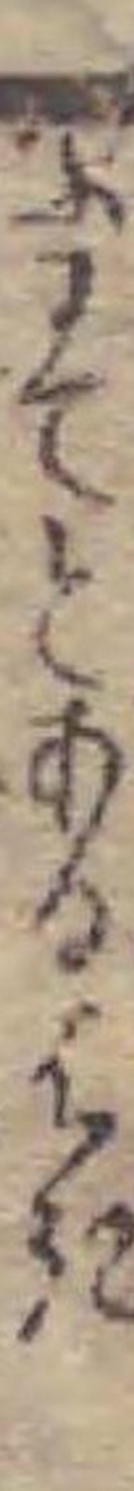ふにてとあるはき
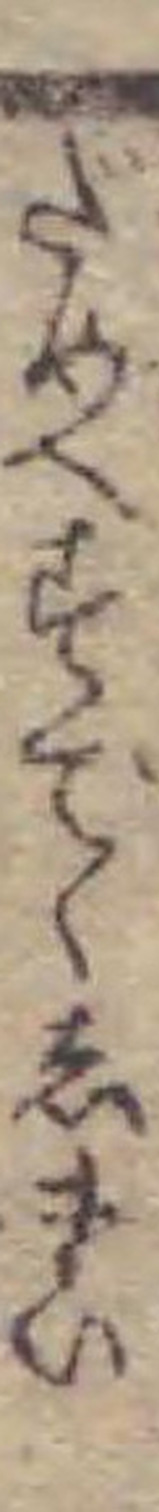だめへすてゝしまい
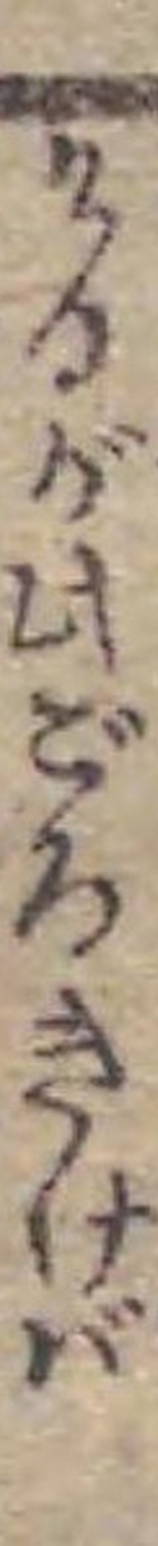けるが此ごろきけば
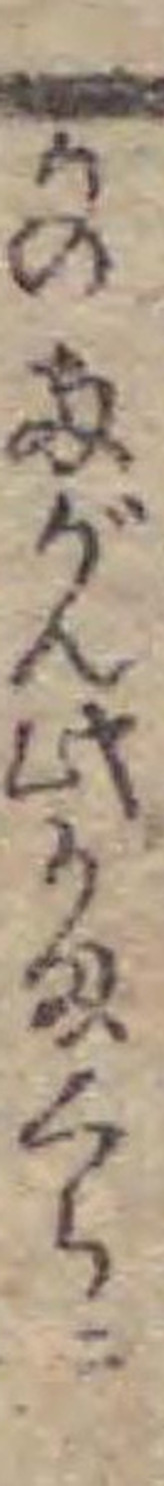かの両がん此かまくらに
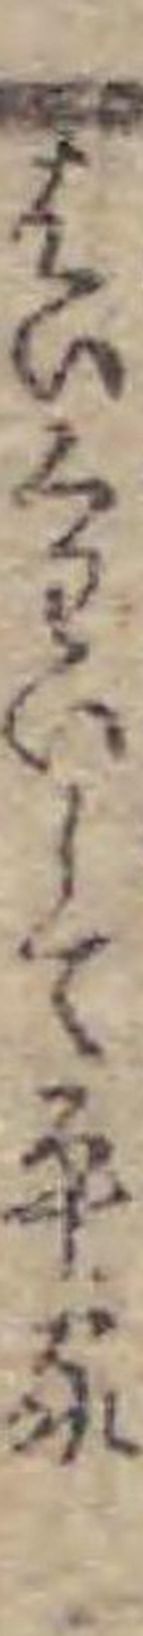はいくわいして平家
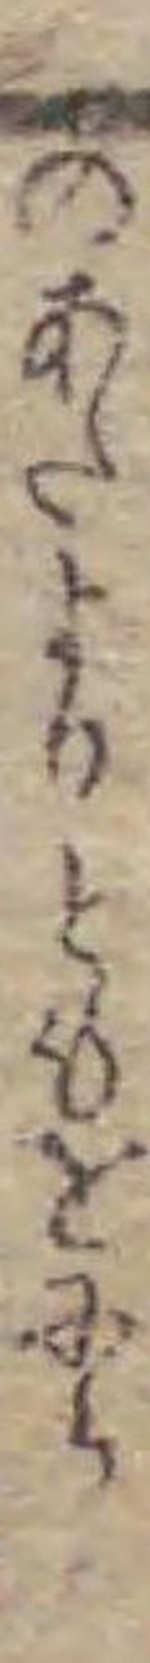のあたよりともをにら
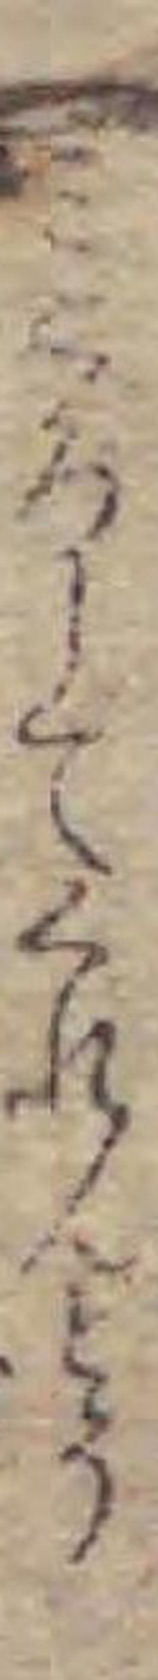みころしてくれんとう
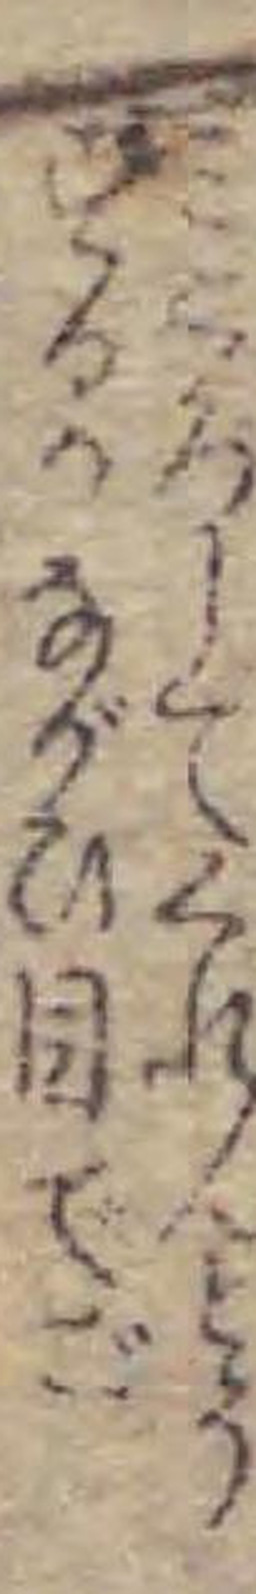するかながひ目でご
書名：悪七変目景清 : 2巻
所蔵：国立国会図書館 National Diet Library, JAPAN
